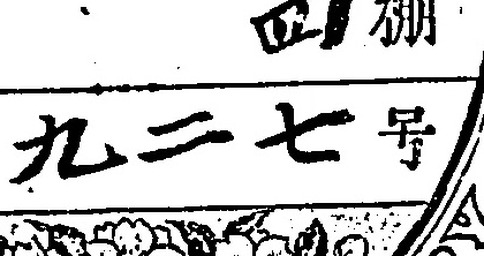九二七号
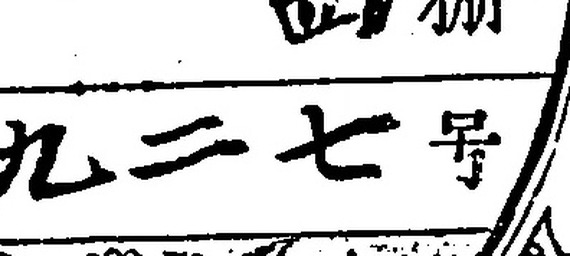九二七号
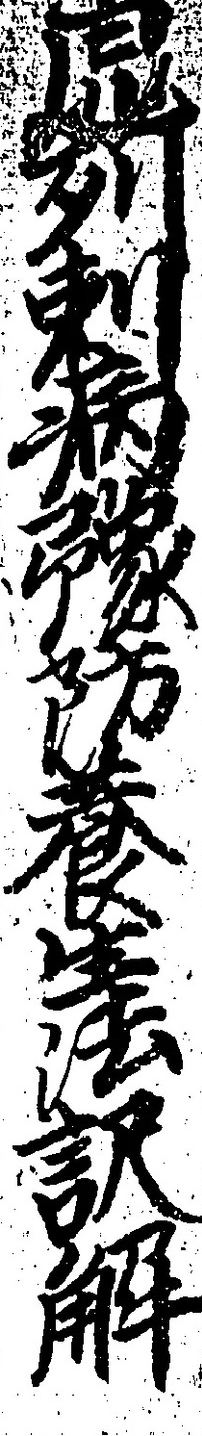虎列刺病予防養生法訳解

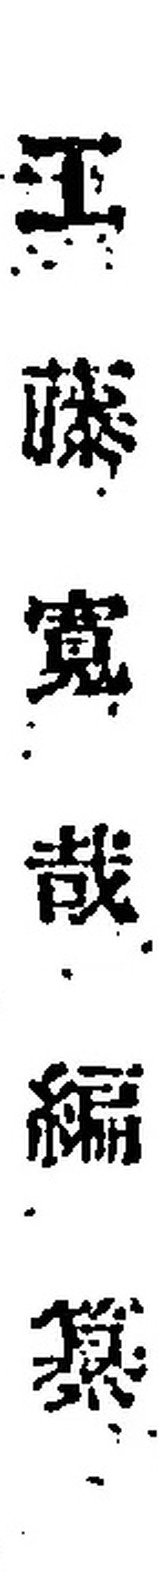工藤寛哉纂
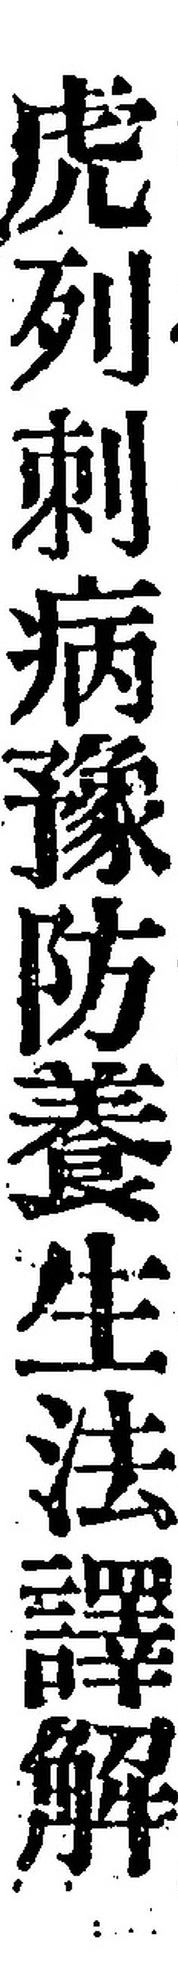虎列刺病豫防養生法譯解

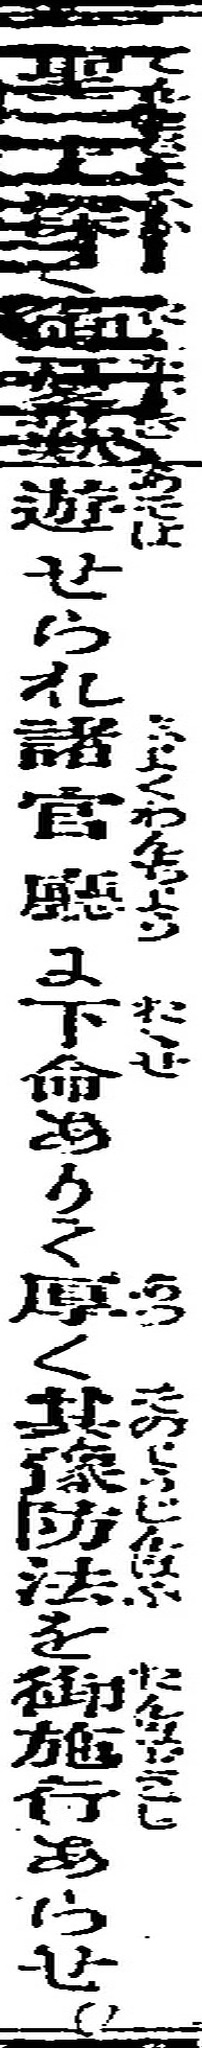聖上深く御憂嘆遊せられ諸官庁廳に下命ありて厚く其豫防法を御施行あらせ
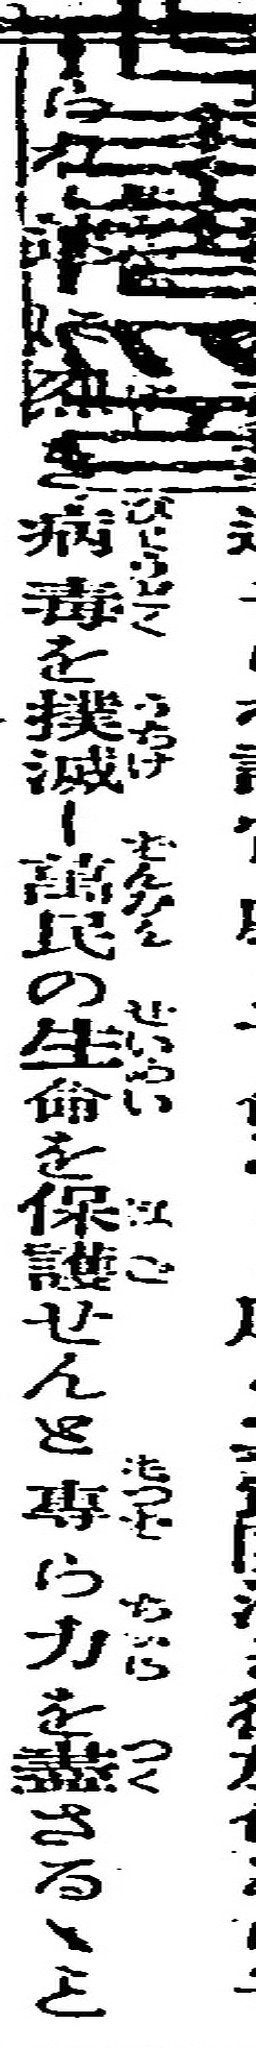られ速に烈き病毒を撲滅し萬民の生命を保護せんと専ら力を盡さるゝこと
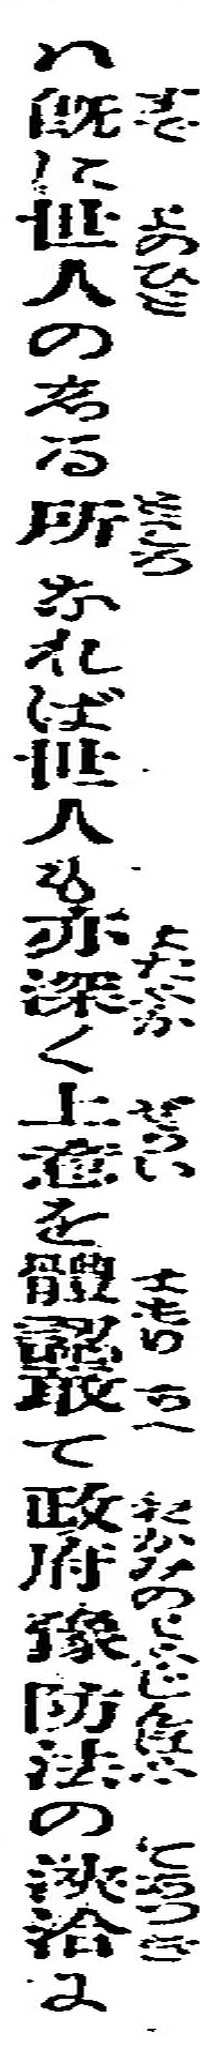は既に世人のしる所なれば世人も亦深く上意を體認敢て政府豫防法の淶洽に
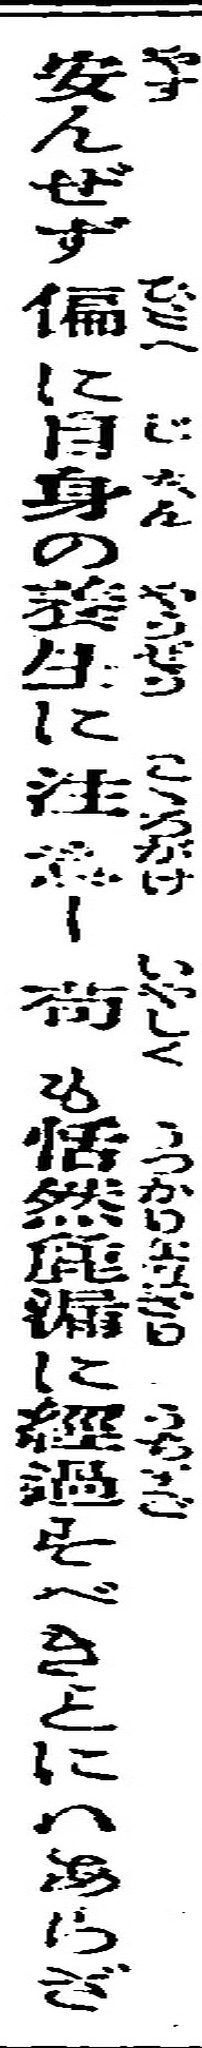安んぜず偏に自身の養生に注意し苟も恬然麁漏に経過すべきことにはあらざ
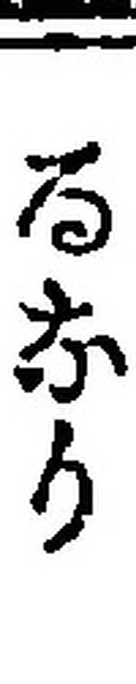るなり
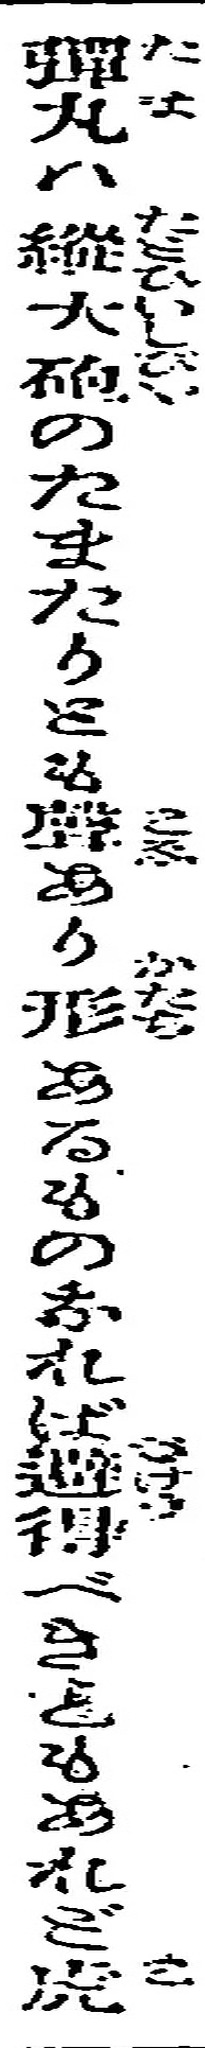弾丸は縦大砲のたまたりとも聲あり形あるものなれば避得べきこともあれど虎
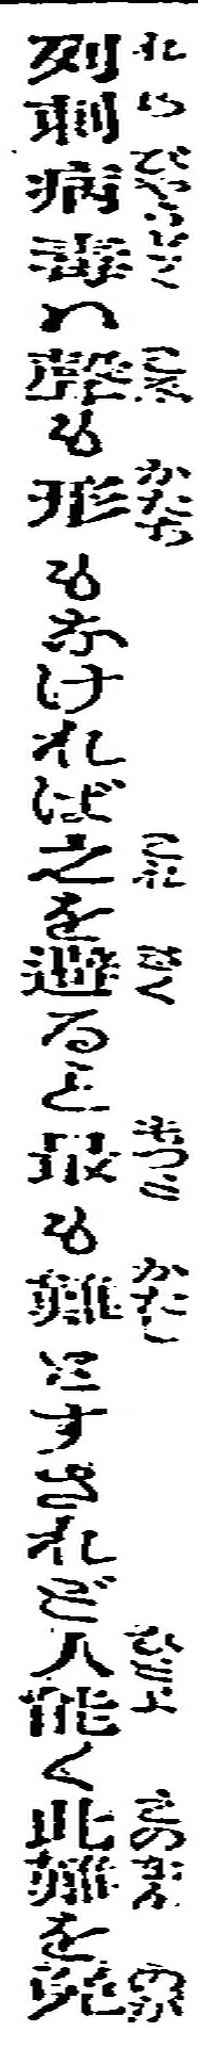列刺病毒は聲も形もなければ之を避ること最も難とすされど人能く此難を免
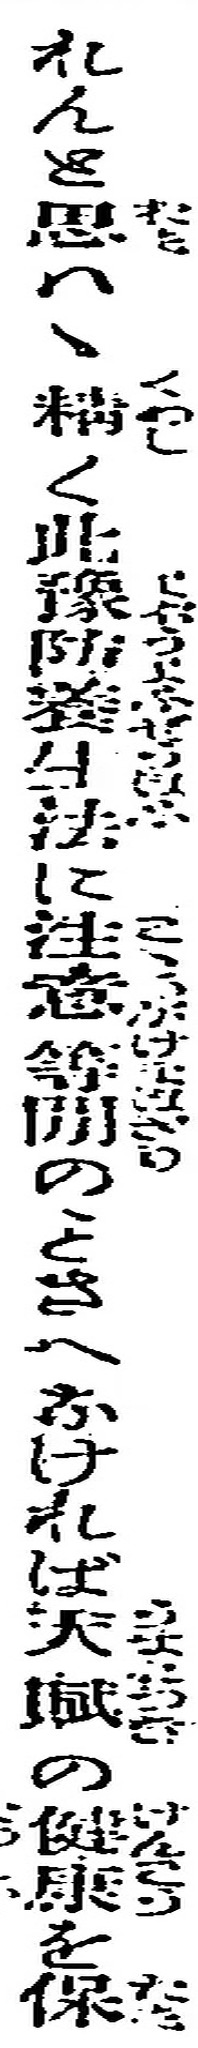れんと思はゝ精く此予防養生法に注意等閒のことさへなければ天賦の建康を保
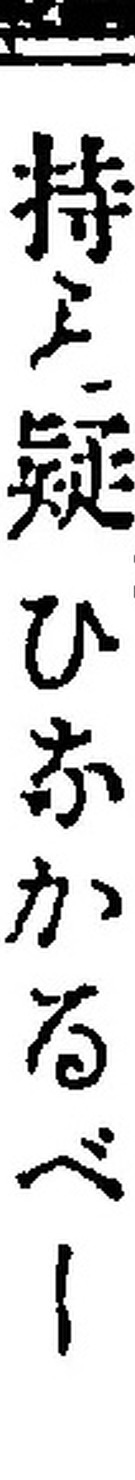持こと疑ひなかるべし

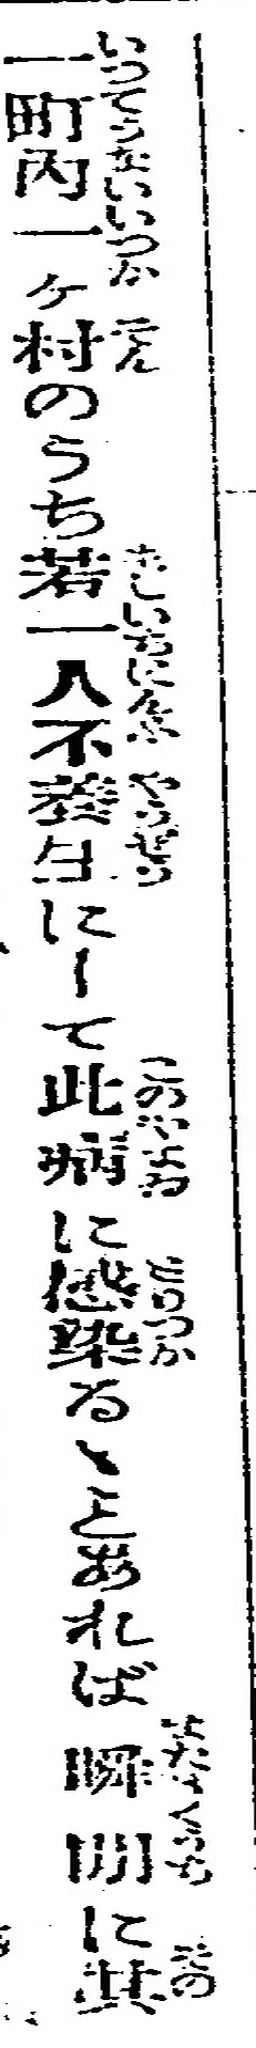一町内一ヶ村のうち若一人不養生にして此病に感染るゝことあれば瞬間に其
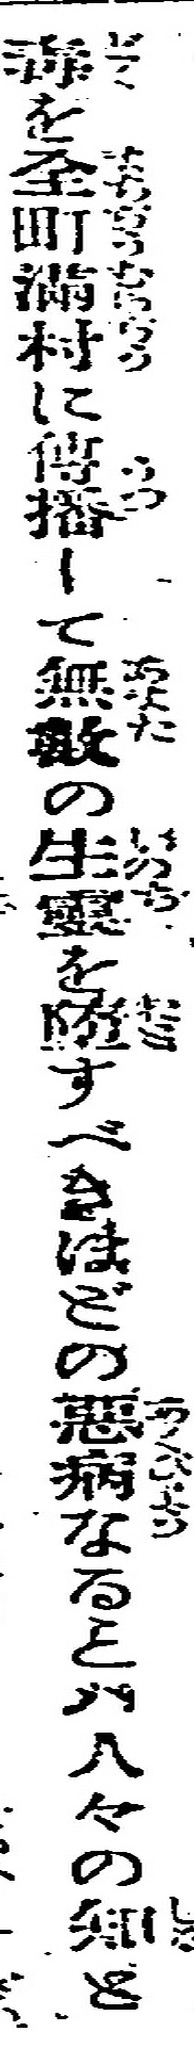毒を全町満村に傳播して無數の生霊を堕すべきほどの惡病なることは人々の知と
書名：虎列剌病予防養生法訳解
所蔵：国立国会図書館 National Diet Library, JAPAN
